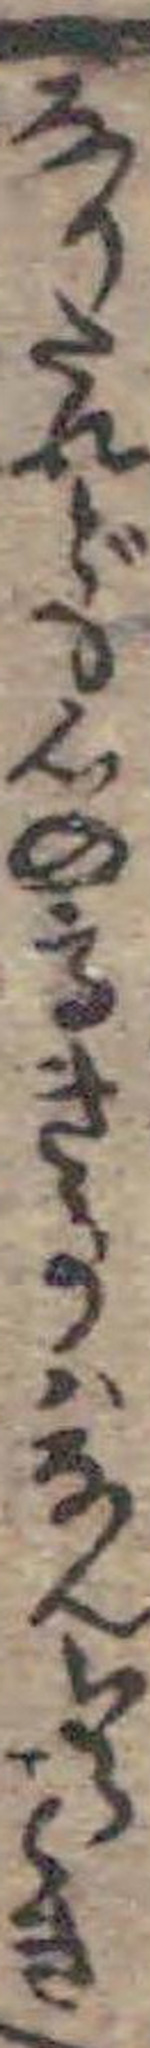なりたれども心の高き事はなんじらことき
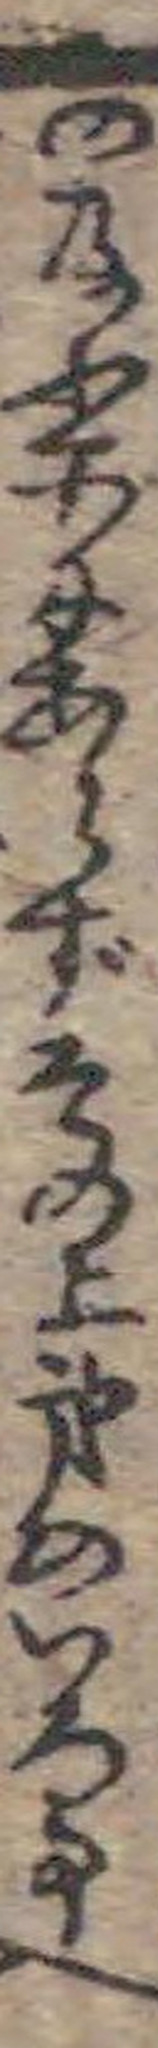の及ふ所にあらずその上弟のいろ事
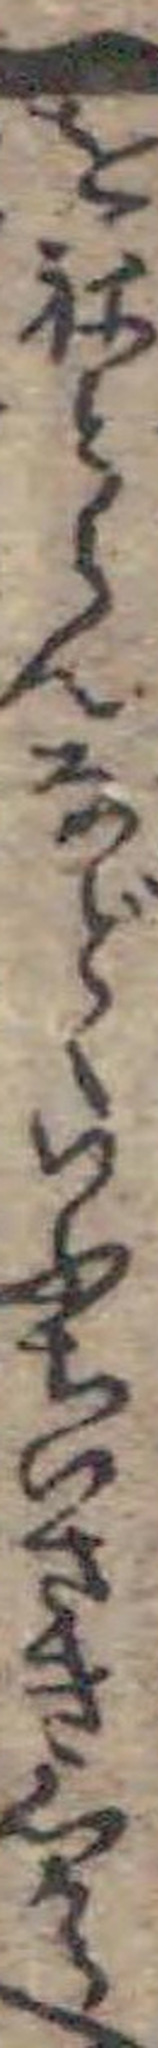をねとらんなどゝいふちいさき心から
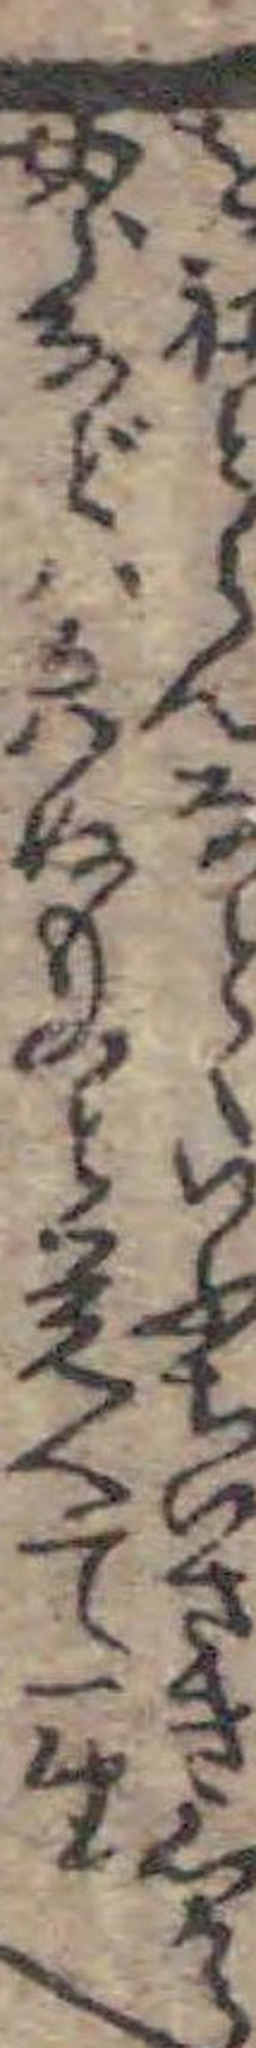女郎などはかはぬものと覚へて一生
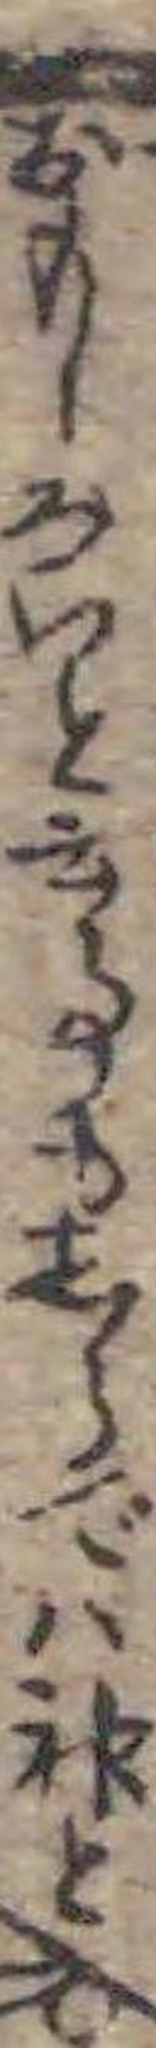おもしろいと云事もしらでは神と
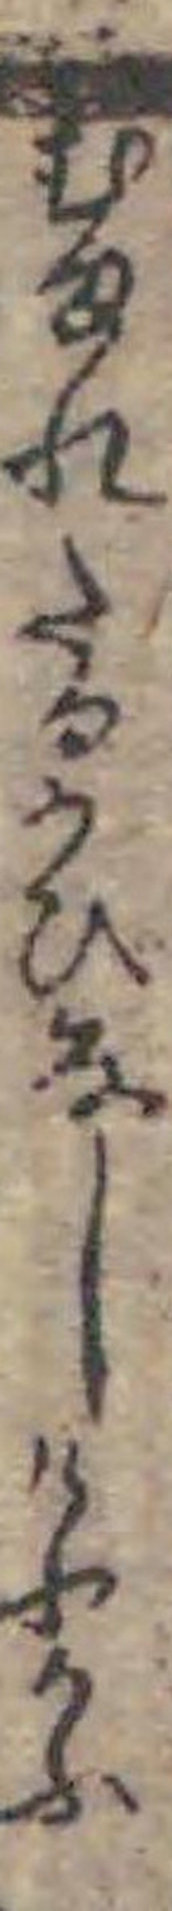むまれたるかひなしけふかふ
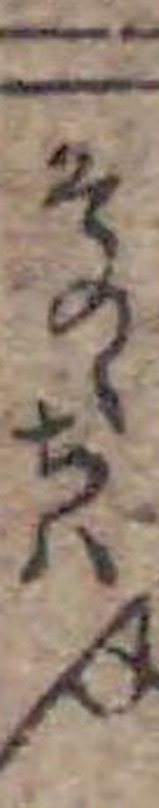そのゝちは
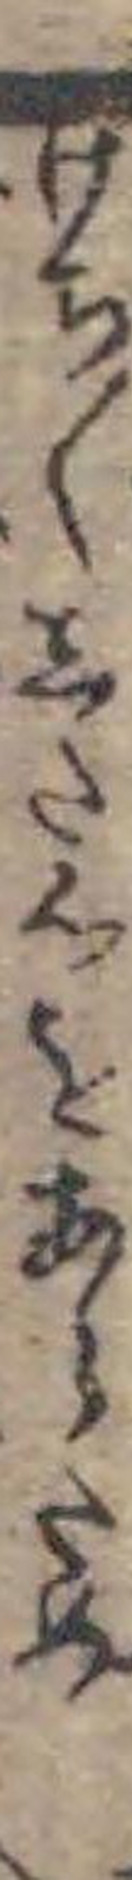けち〳〵した心をあらため
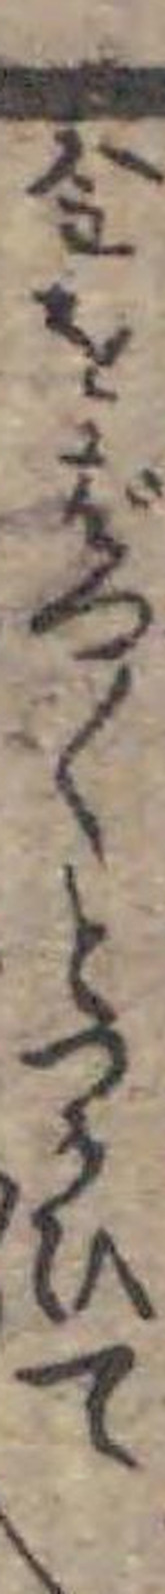金をばつ〳〵とつかひて
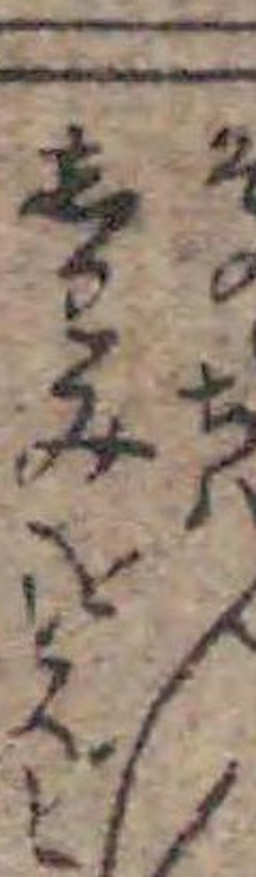しわみをとんと
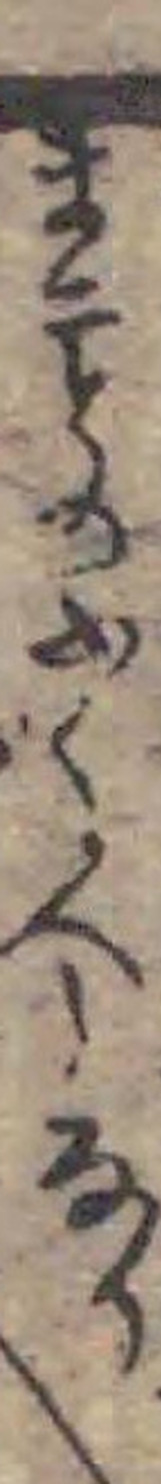まことのふく人となり
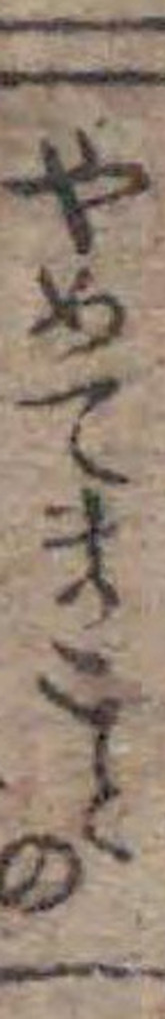やめてまことの
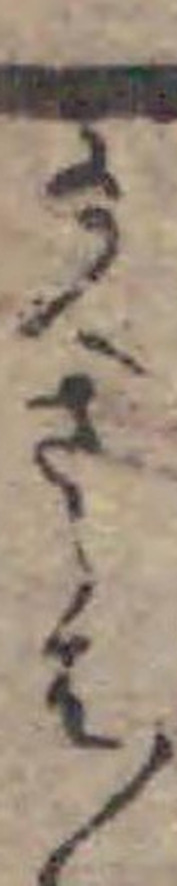給へさらは〳〵
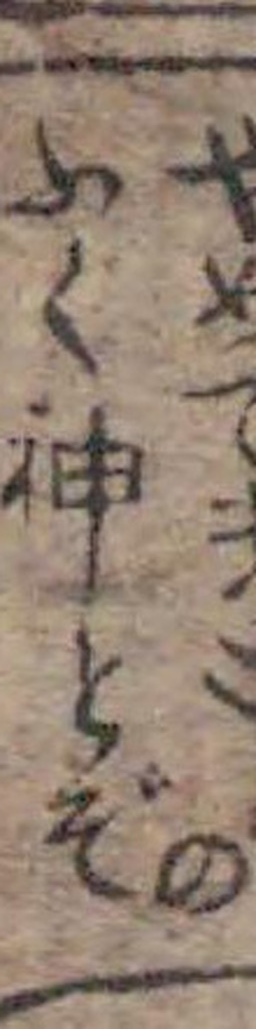ふく神とぞ
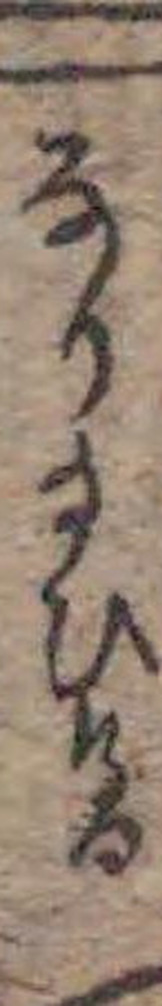なり給ひける
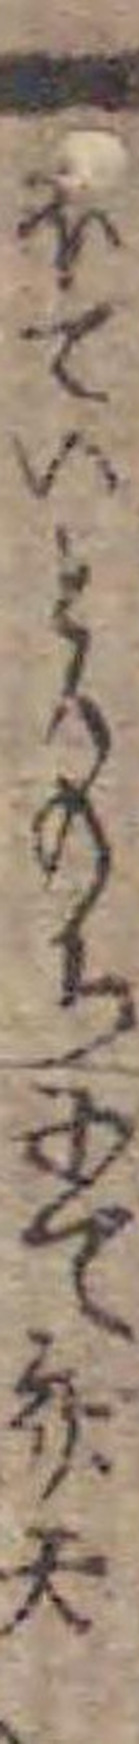ほていとりもちにて弁天
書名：蛭子大黒壮年過 : 2巻
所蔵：国立国会図書館 National Diet Library, JAPAN
